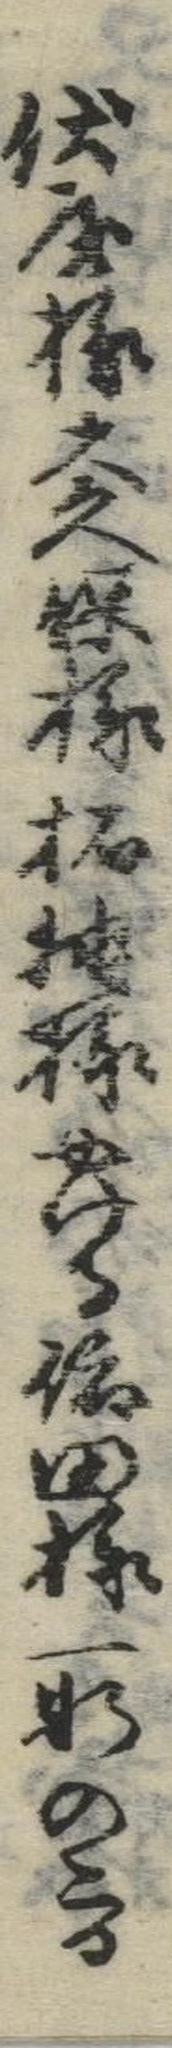伏屋様大久保様柘植様やける依田様一軒のこる
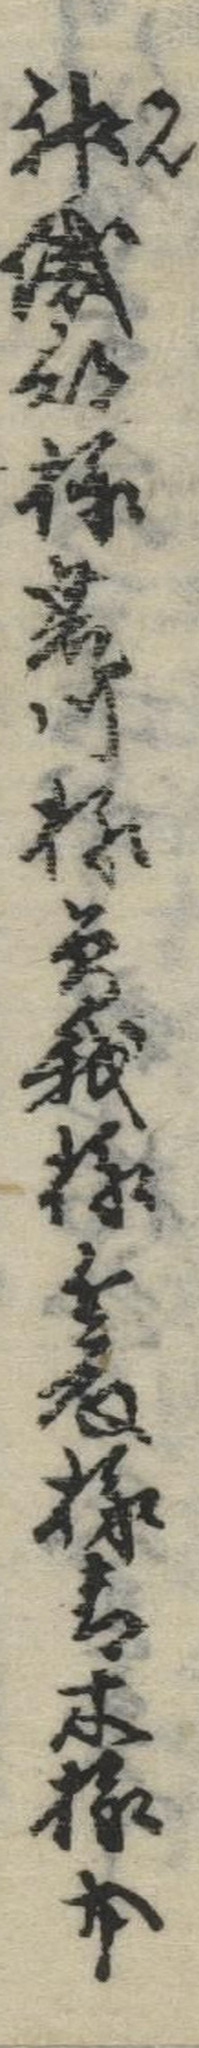神織部様荒川様曽我様近藤様青木様本
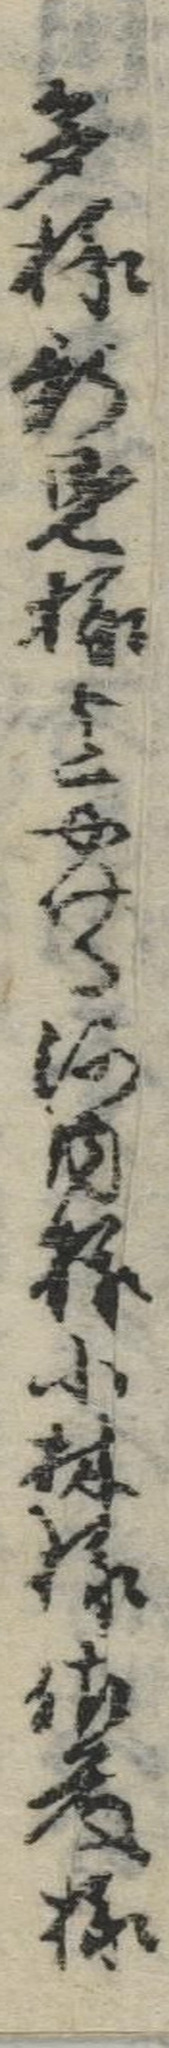多様新見様迄やける河内様小林様佐藤様
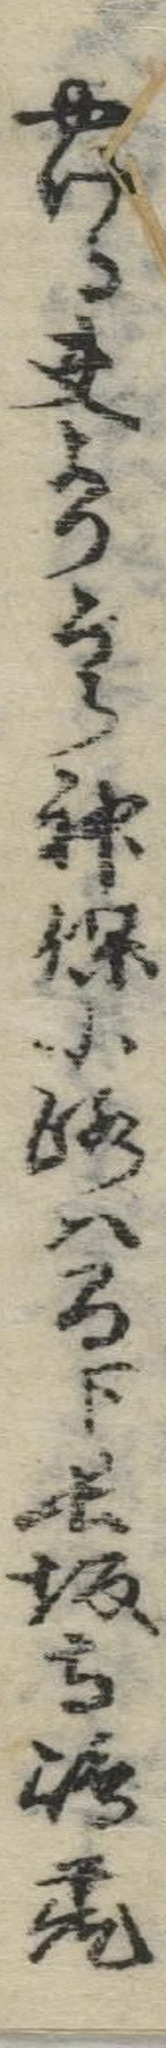やける夫よりうら神保小路ハ間下長坂守嶋蔵
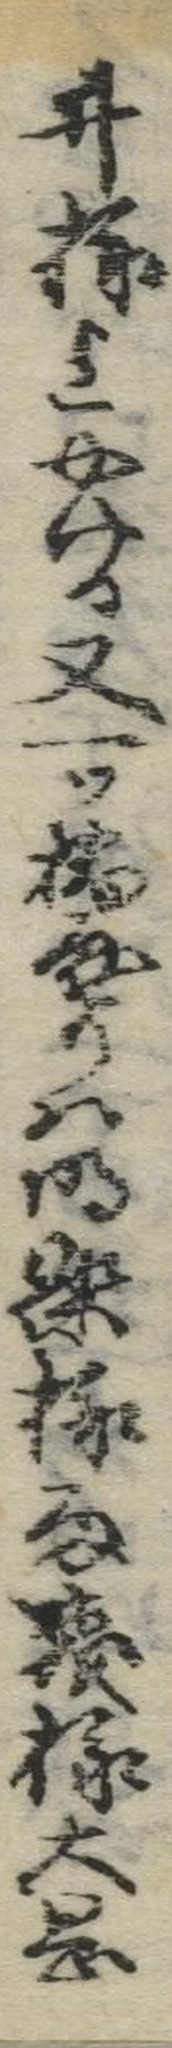井様迄やける又一ッ橋通りハ明楽様雨森様大岡
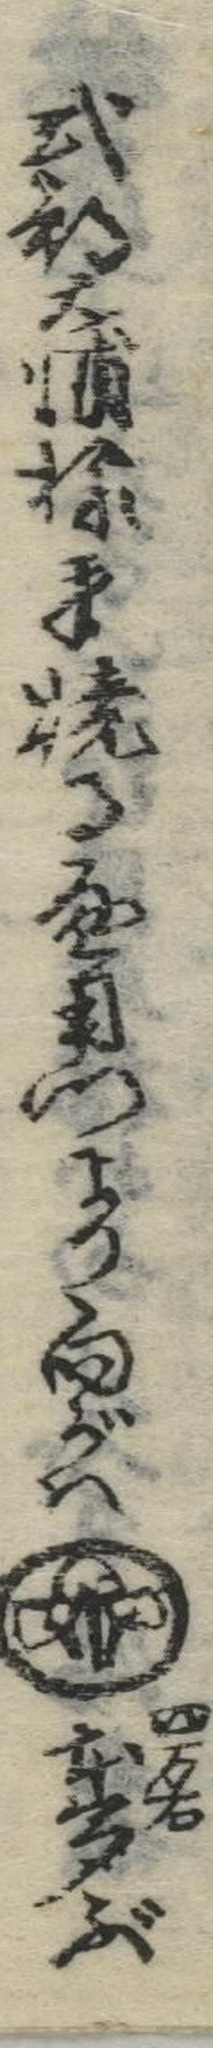式部大輔様半焼る通用門より向がハ四万石本多ぶ
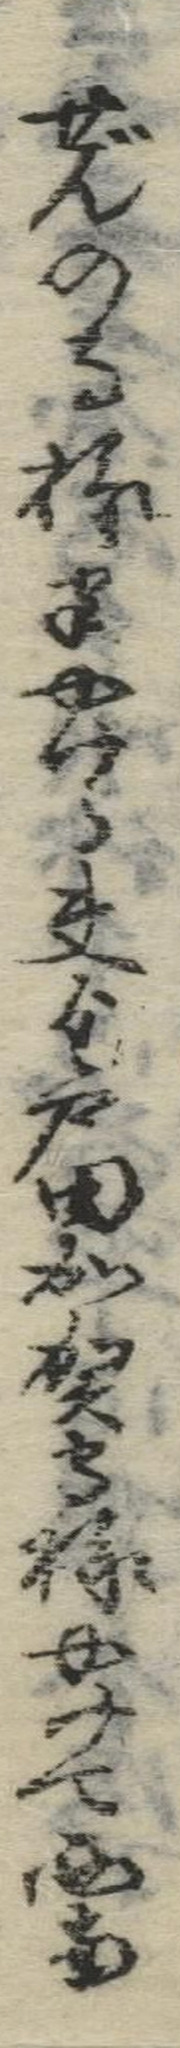ぜんの守様半やける夫より戸田加賀守様やけて西南
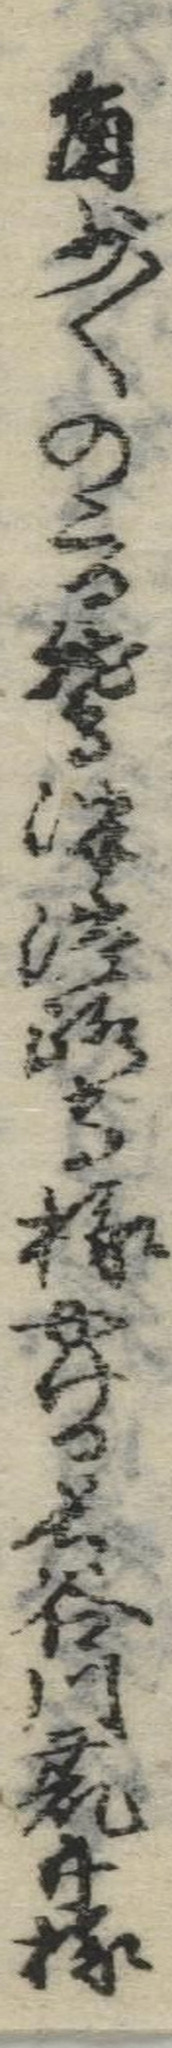角少々のこる鷲津淡路守様やける長谷川荒井様
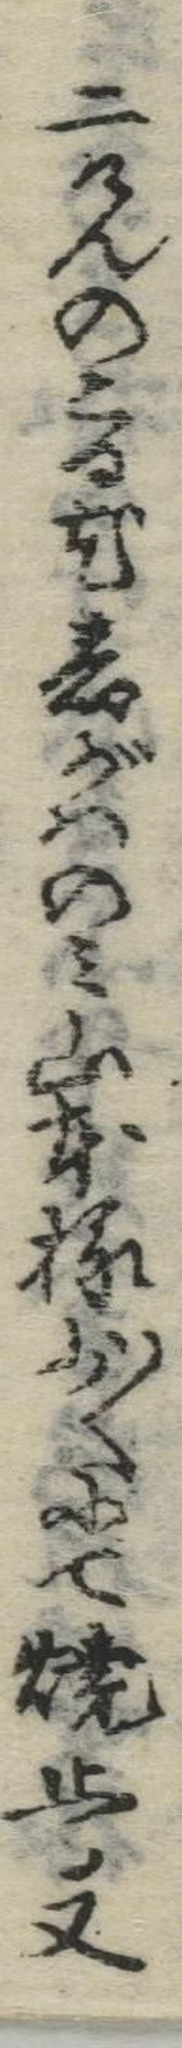二けんのこる尤表がハのミ山本様少々にて焼止る又
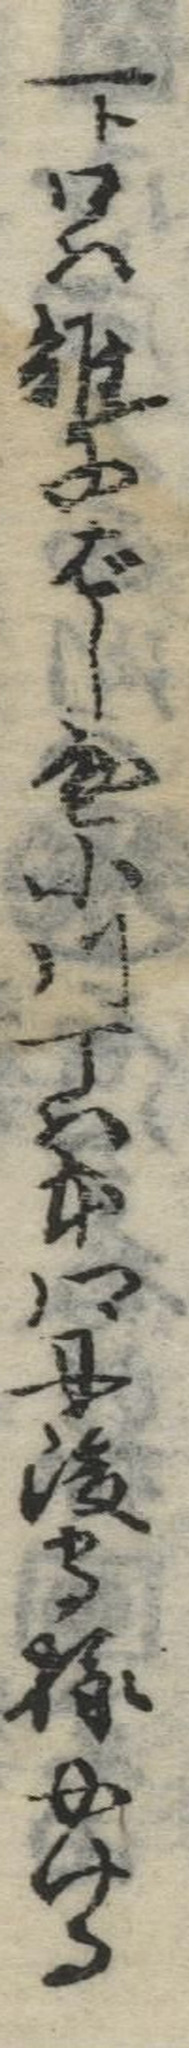一ㇳ口ハ雉子ばし通小川丁ハ本郷丹後守様やける
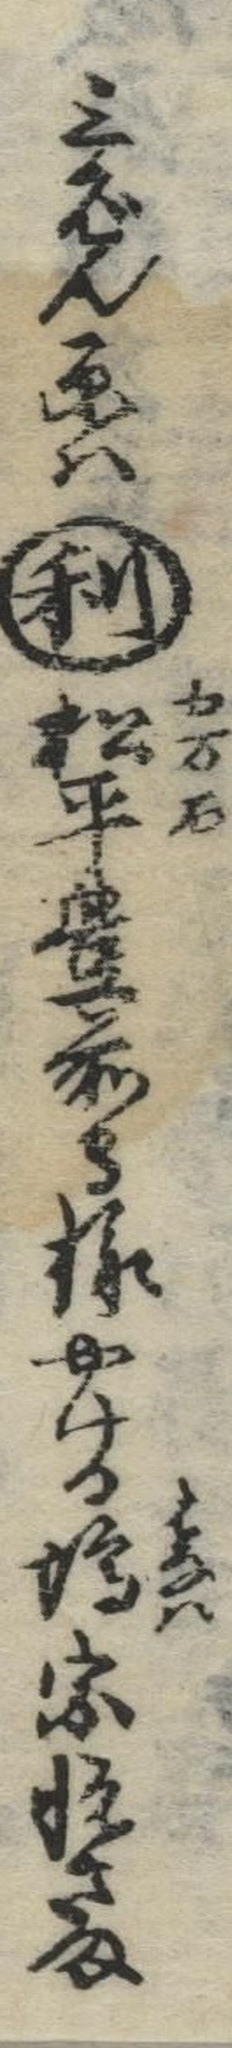三ばん原ハ五万石松平豊前守様やける塙宗悦さま
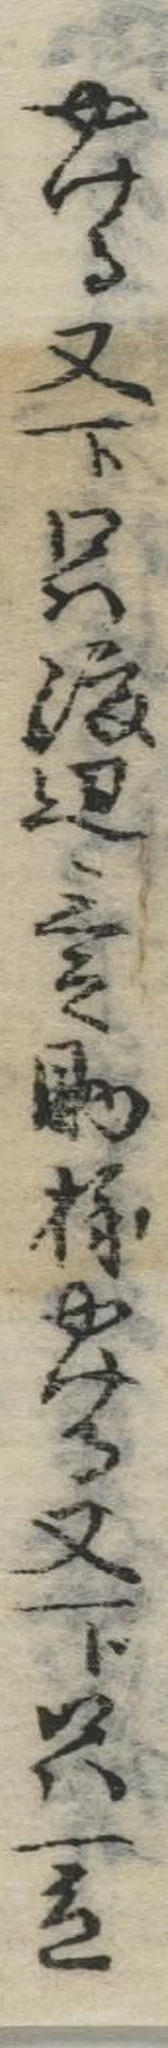やける又一口ハ渡辺三之助様やける又一口ハ一色
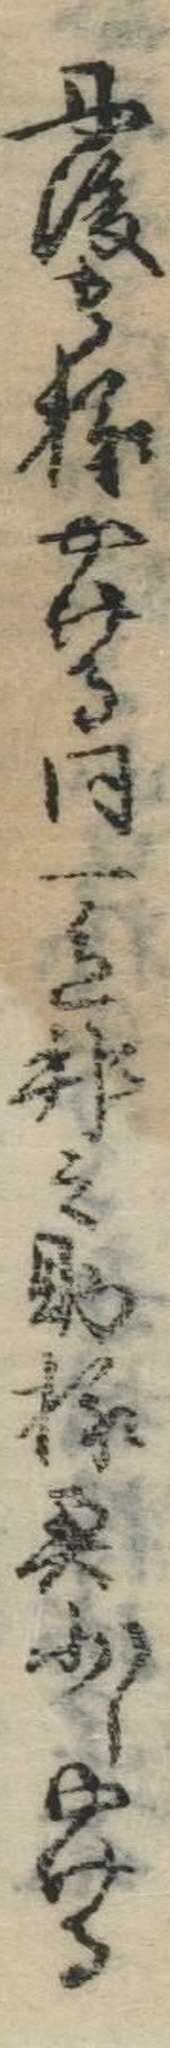丹後守様やける同一色邦之助様奥少しやける
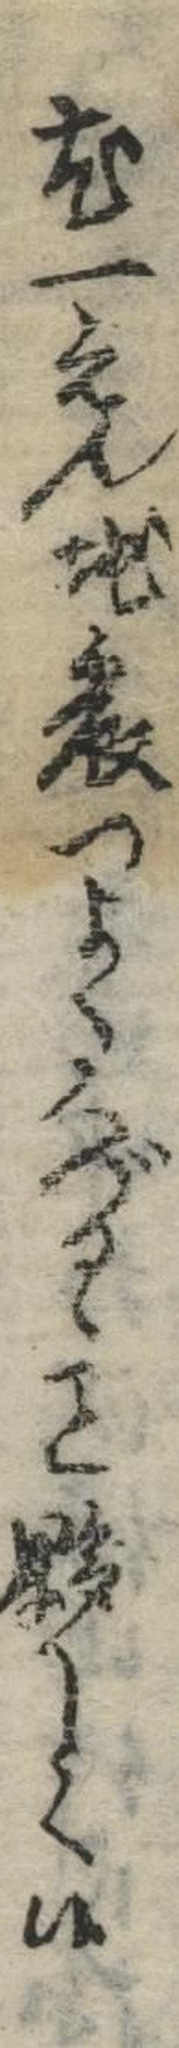尤一えん地震つよくくづるゝこと夥しく候
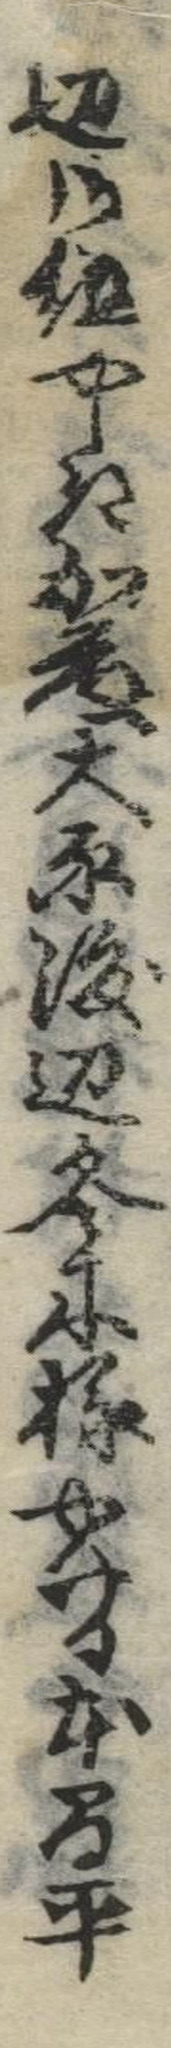辺御組やしき加藤大原渡辺冬木様やける本間平
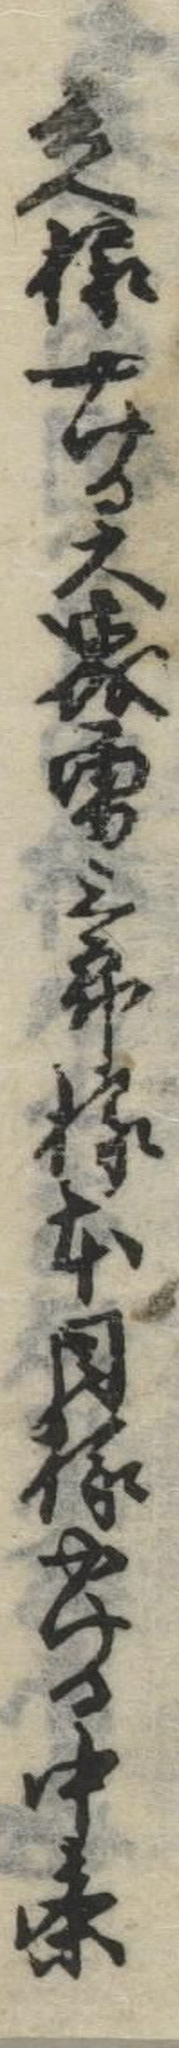兵へ様やける大森勇三郎様本目様やける中条
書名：安政二卯十月二日夜四ツ時過　御府内御屋敷方市中共　地震類焼場所明細書之寫　并街道筋近郷聞書
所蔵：東京大学地震研究所図書室 Earthquake Research Institute Library, The University of Tokyo, JAPAN
